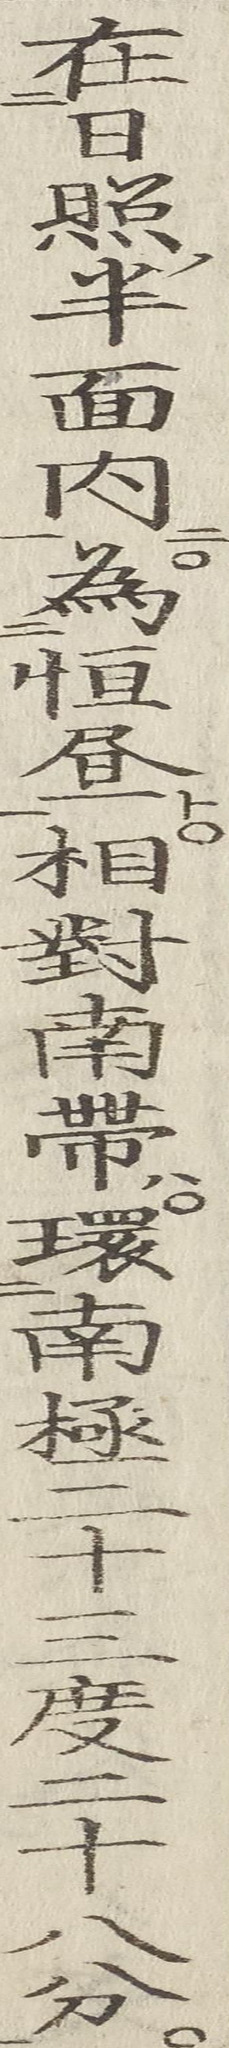在ニ日照半面内。為ニ恒昼。相対南帯。環ニ南極二十三度ニ十八分。

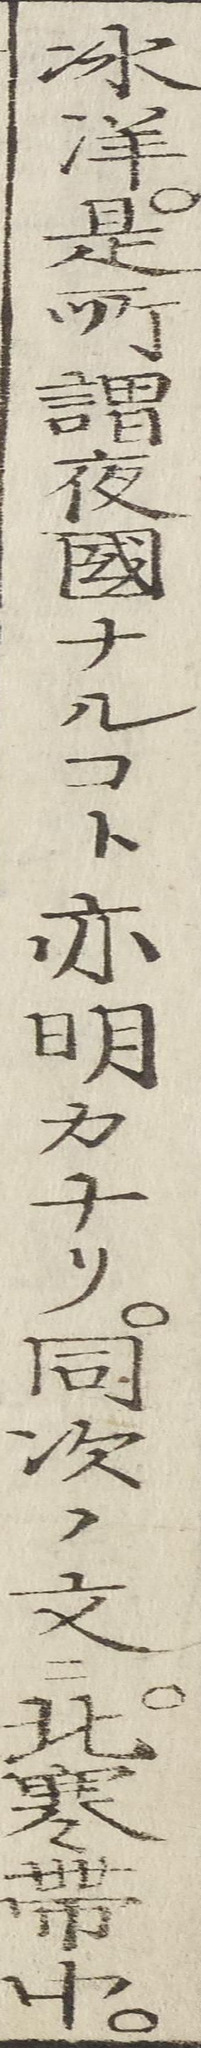冰洋。是所謂夜国ナルコト亦明カナリ。同次ノ文ニ。北寒帯中。
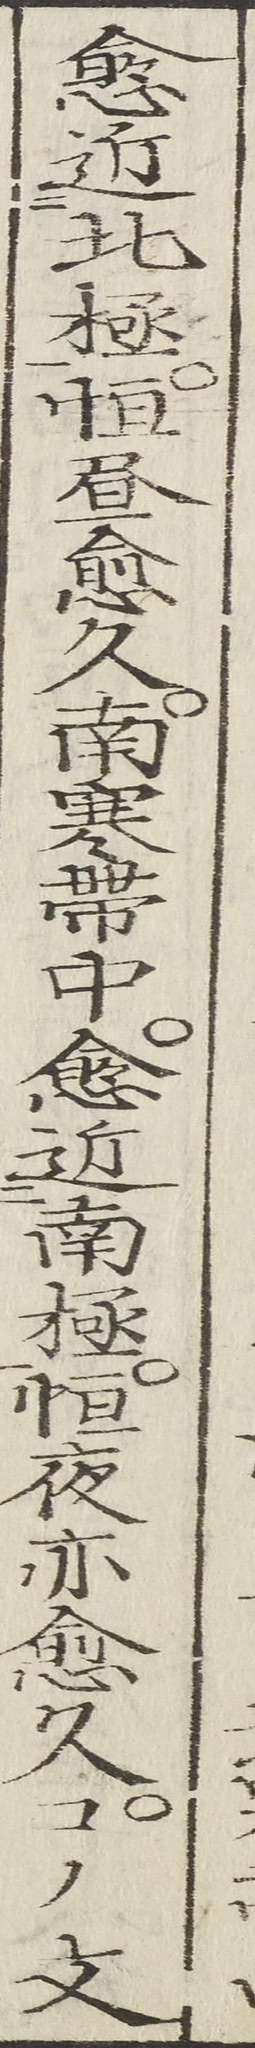愈近ニ北極。恒昼愈久。南寒帯中。愈近ニ南極。恒夜亦愈久。コノ文
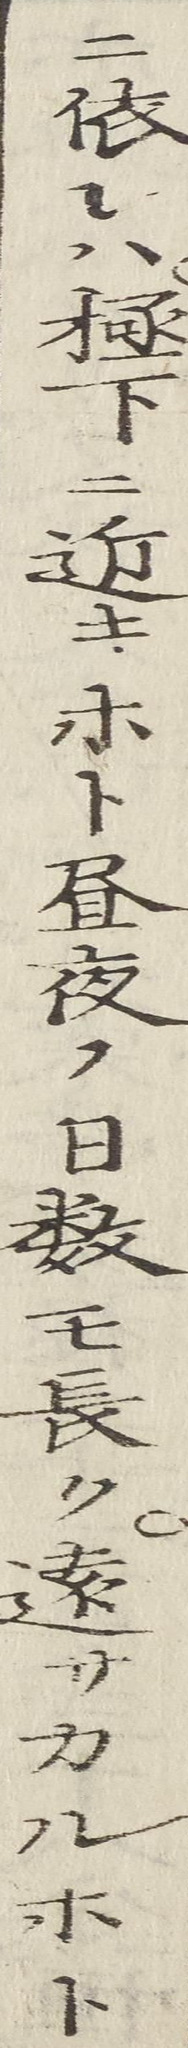ニ依レハ。極下ニ近キホト昼夜ノ日数モ長ク。遠サカルホト
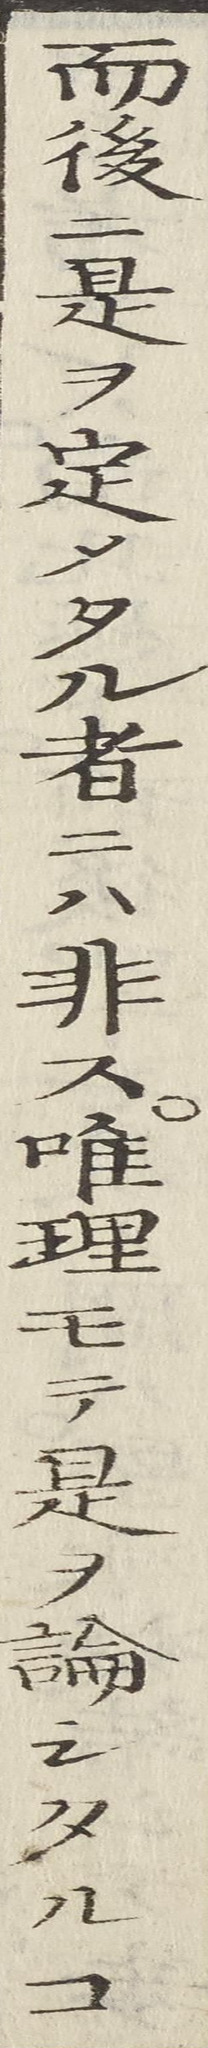而後ニ是ヲ定メタル者ニハ非ス。唯理モテ是ヲ論シタルコ
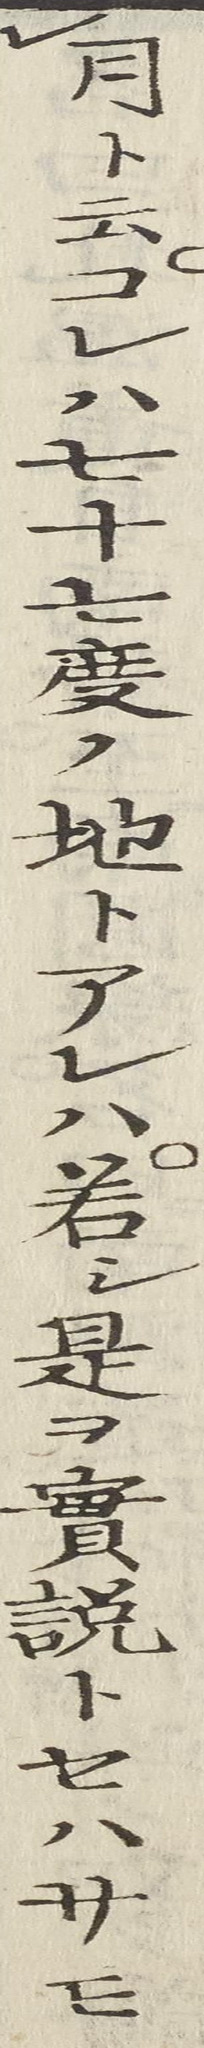月ト云。コレハ七十七度ノ地トアレハ。若シ是ヲ実説トセハサモ
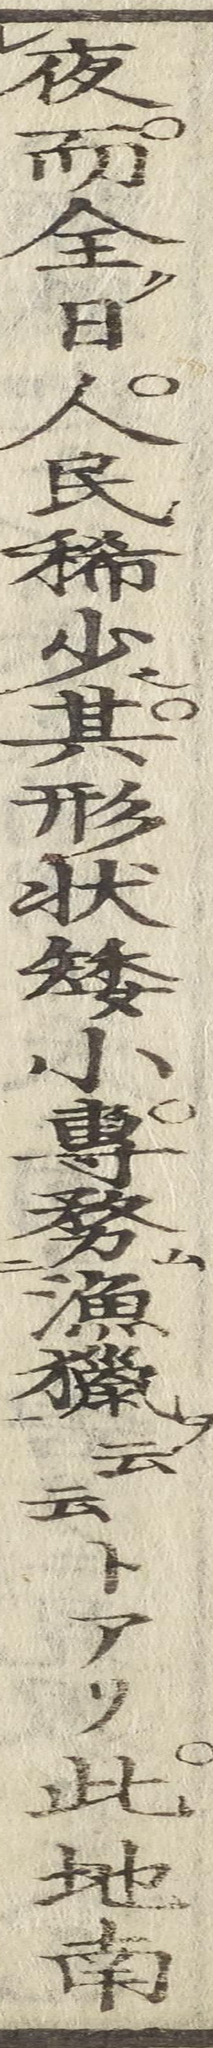夜。而全日。人民稀少也。其形状矮小。専務ニ漁獵云云トアリ。此地南
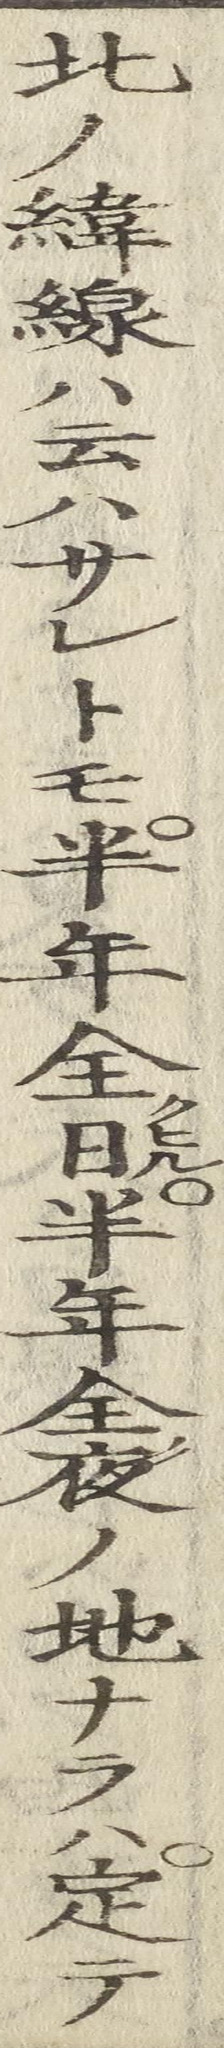北ノ緯線ハ云ハサレトモ。半年全日。半年全夜ノ地ナラハ。定テ
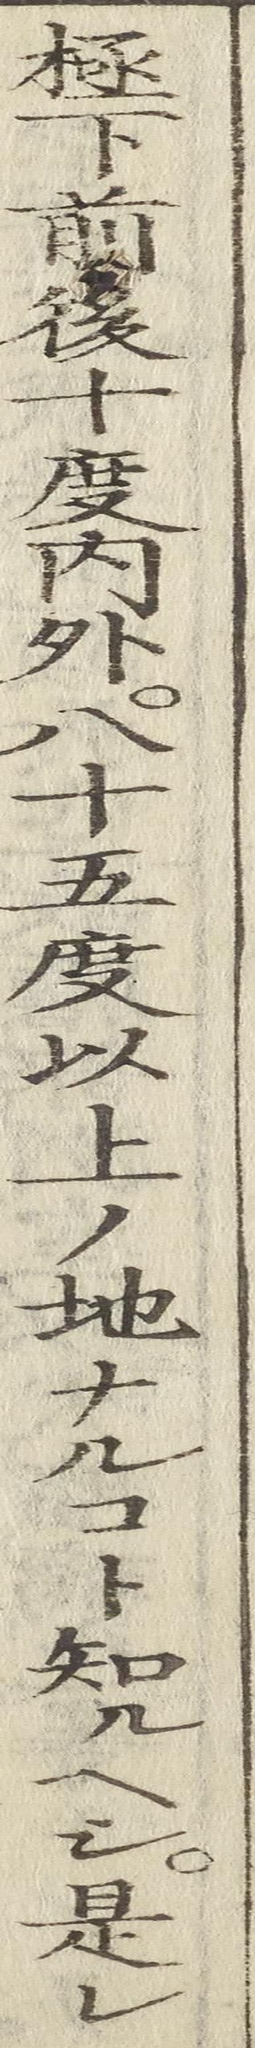極下前後十度内外。八十五度以上ノ地ナルコト知ルヘシ。是レ
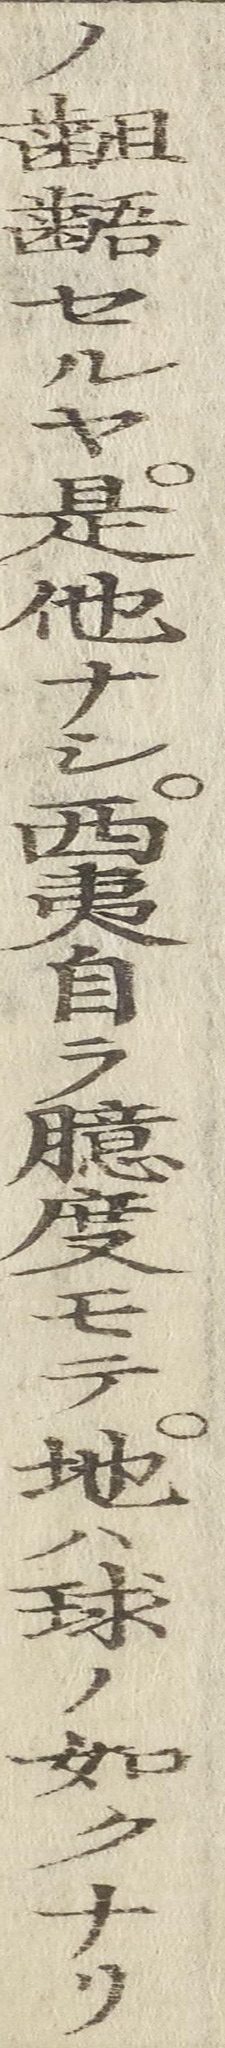ノ齟齬セルヤ。是他ナシ。西夷自ラ臆度モテ。地ハ球ノ如クナリ
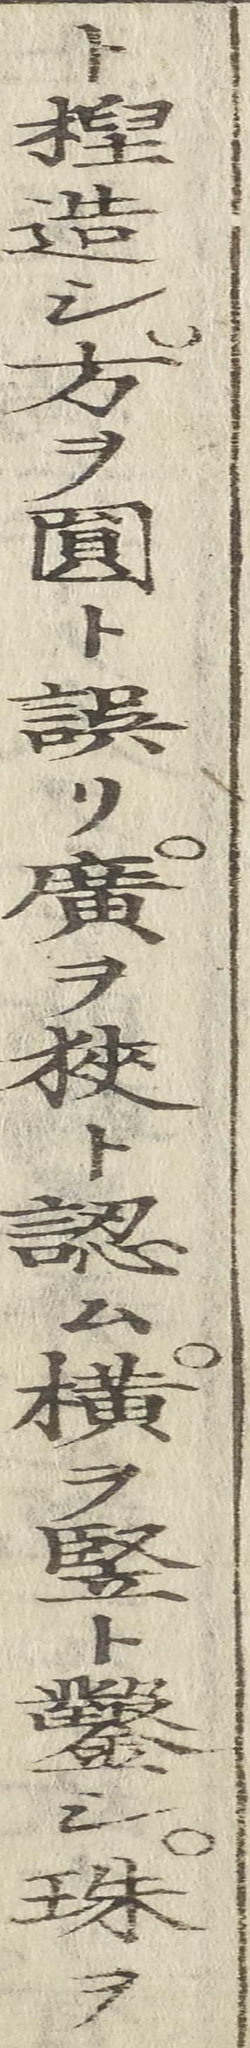ト捏造シ。方ヲ円ト誤リ。広ヲ狭ト認ム。横ヲ竪ト鑿シ。珠ヲ

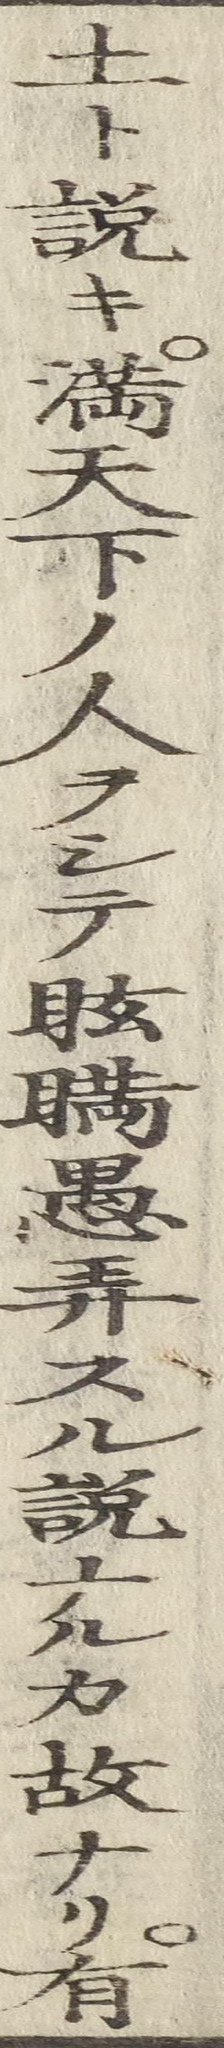土ト説キ。満天下ノ人ヲシテ眩瞞愚弄スル説ナルカ故ナリ。有
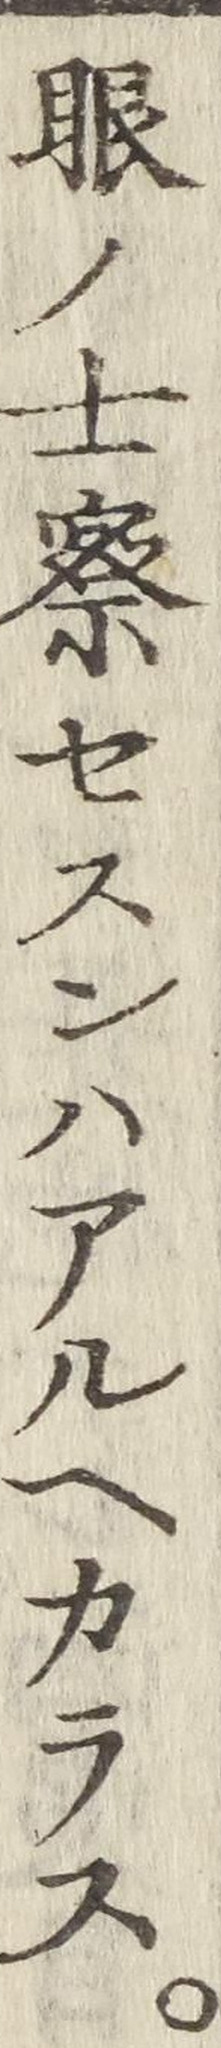眼ノ士察セスンハアルヘカラス。
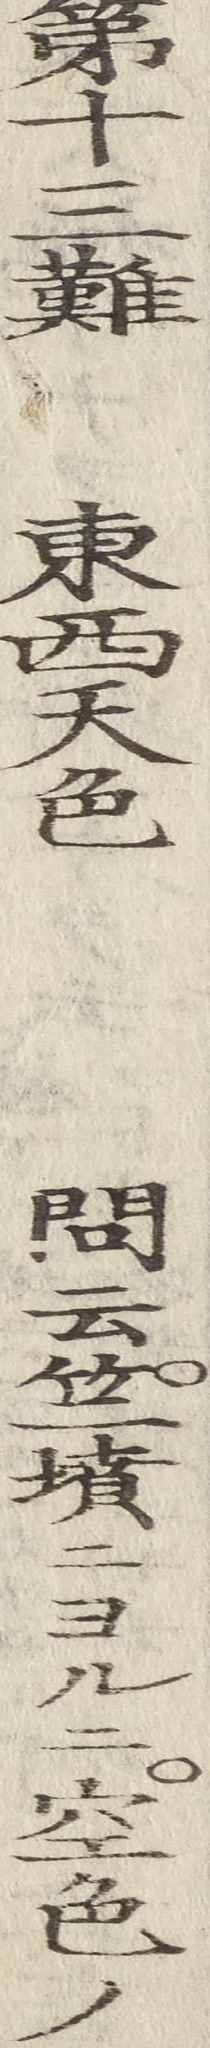第十三難東西天色問云。竺墳ニヨルニ。空色ノ
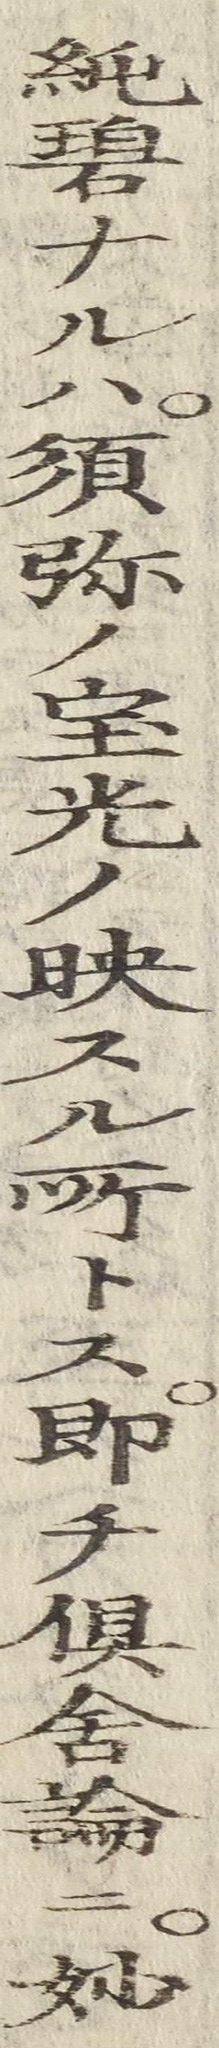純碧ナルハ。須弥ノ宝光ノ映スル所トス。即チ俱舎論ニ。妙
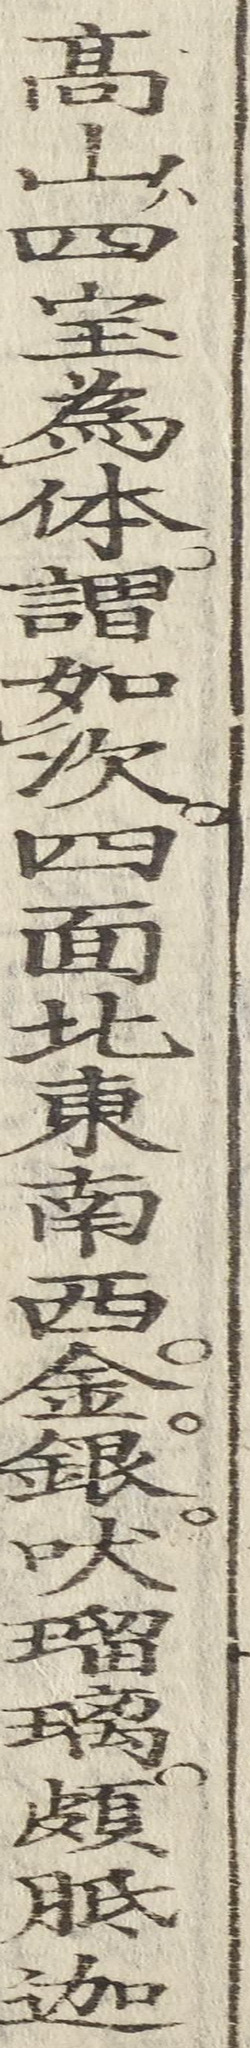高山四宝為体。謂如次。四面北東南西。金。銀。吠瑠璃。頗胝迦
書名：護法新論　二編　上
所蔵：東京大学地震研究所図書室 Earthquake Research Institute Library, The University of Tokyo, JAPAN
